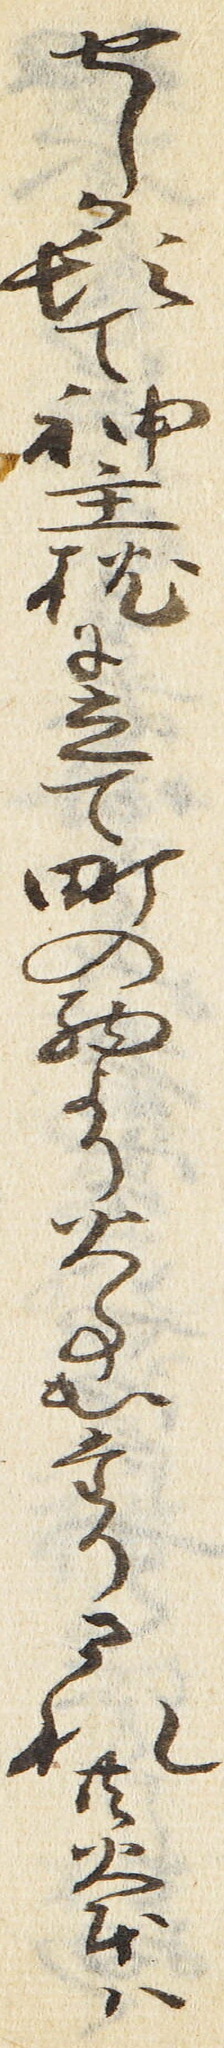せしか頓て神主枕に立て町の西より火事出たりされ共火本は
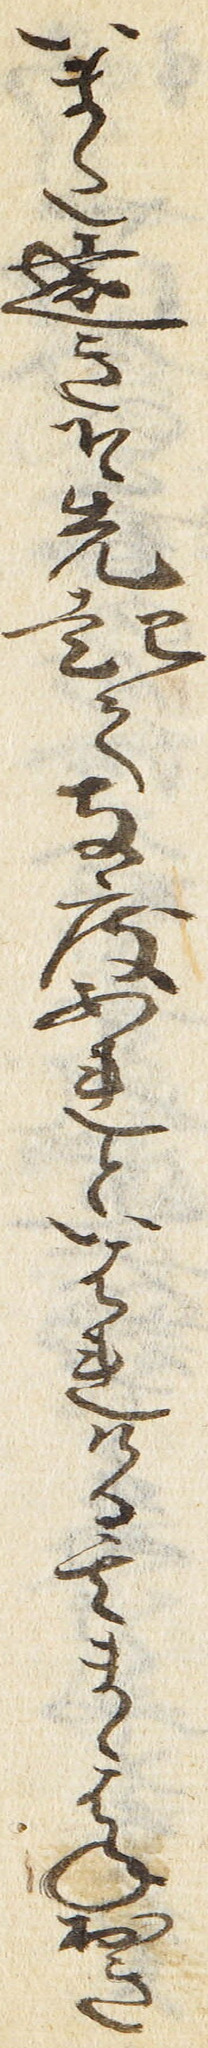いまた遠きそ先起て支度あれといはれける其まゝはねおき
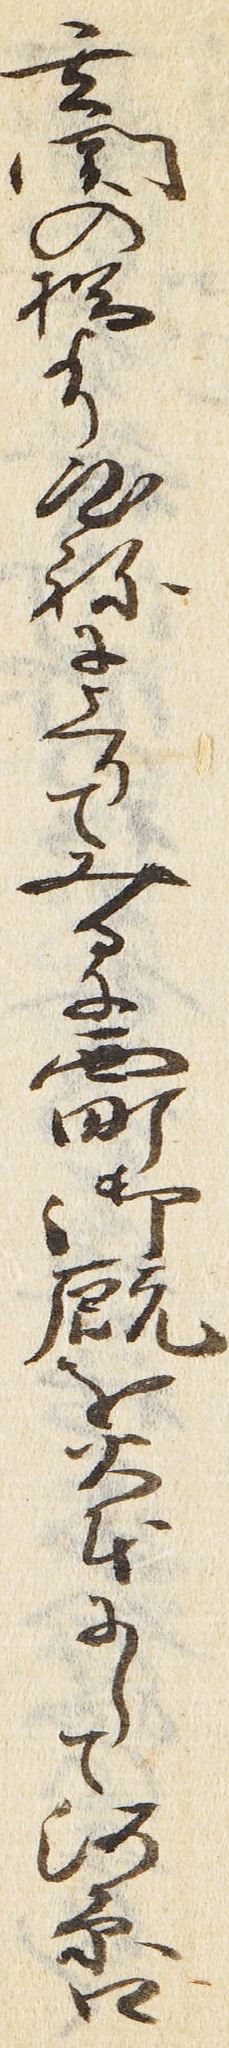玄関の橋よりやねに上りてみるに西町御厩を火本にして河原口
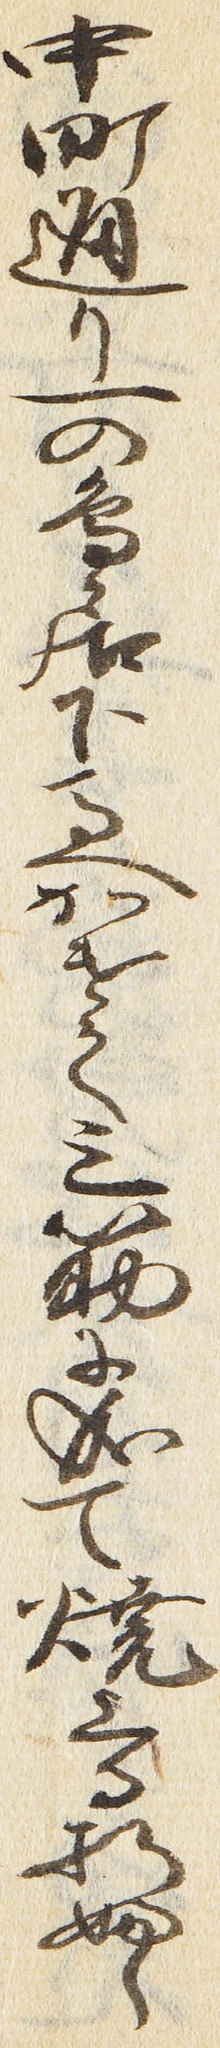中町通り一の鳥居下馬へかけて三筋に成て焼上る折ふし
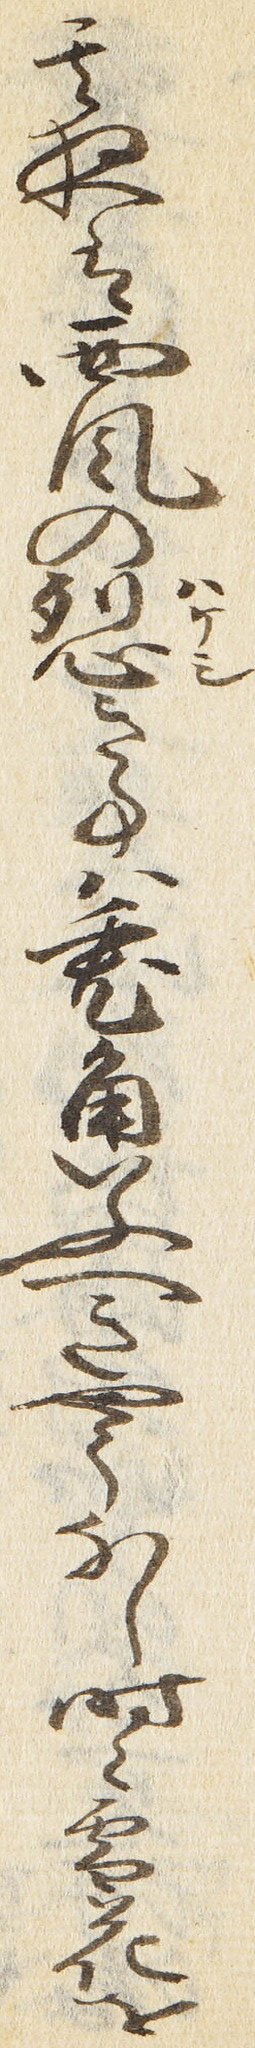其夜は西風の烈き事は兎角いふへきやうなし時々雪花を
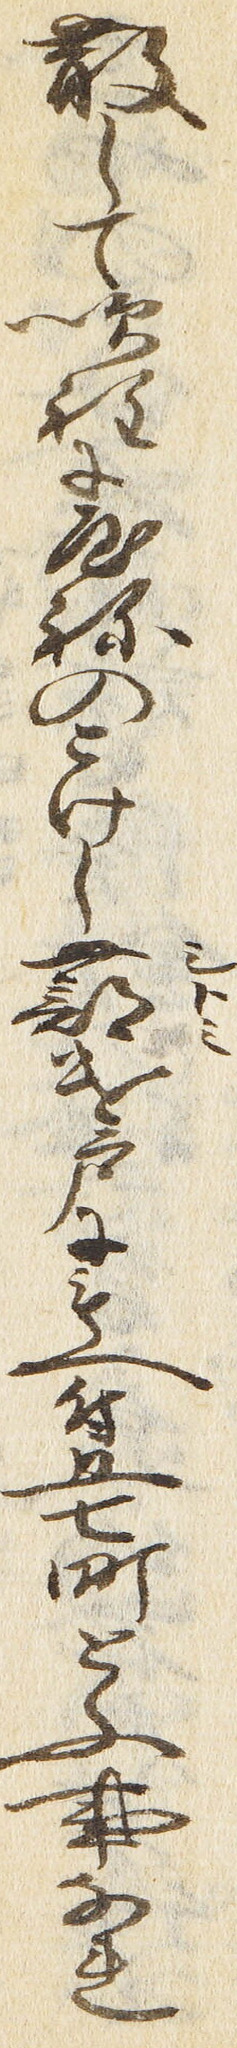散して吹程にやねのこけし蔀遣戸にもへ付五七町とふ事なれ
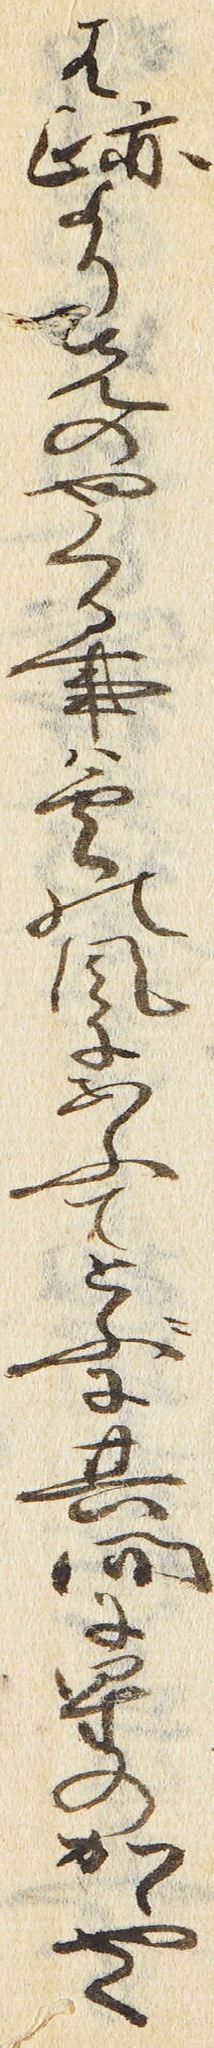は跡より先のやくる事は雲の風にあふてとぶに其間に星のかゝやく
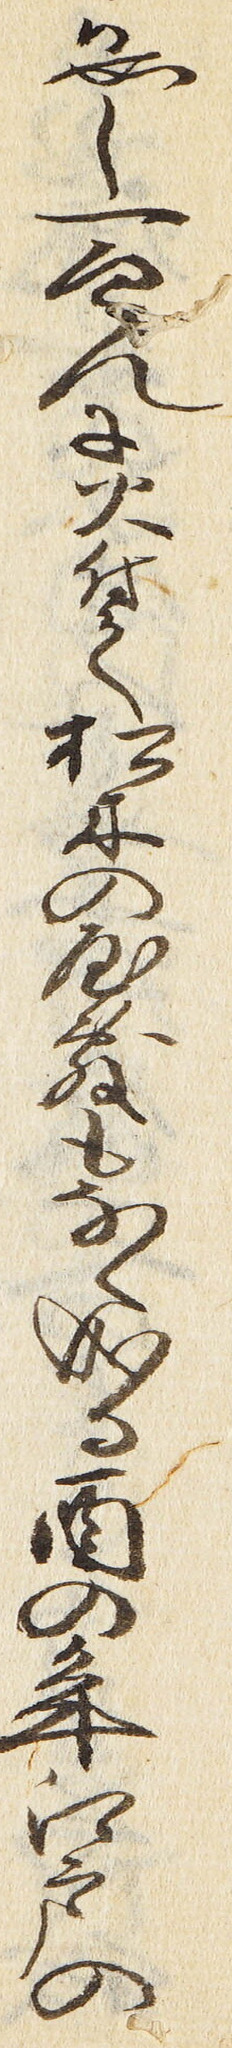か如し一へんに火付て松木の家敷もなく成る酉の年江戸の
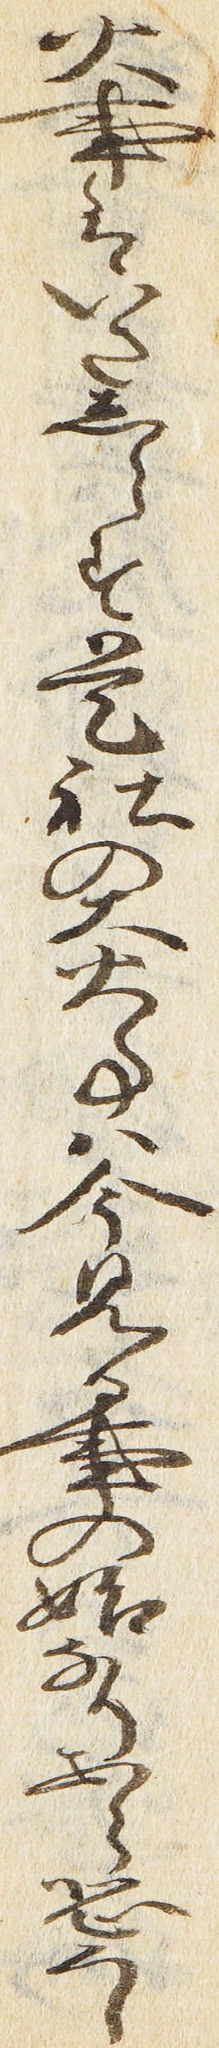火事はいさしらす是社の大火事は今見る事の始なりあらお恐ろし
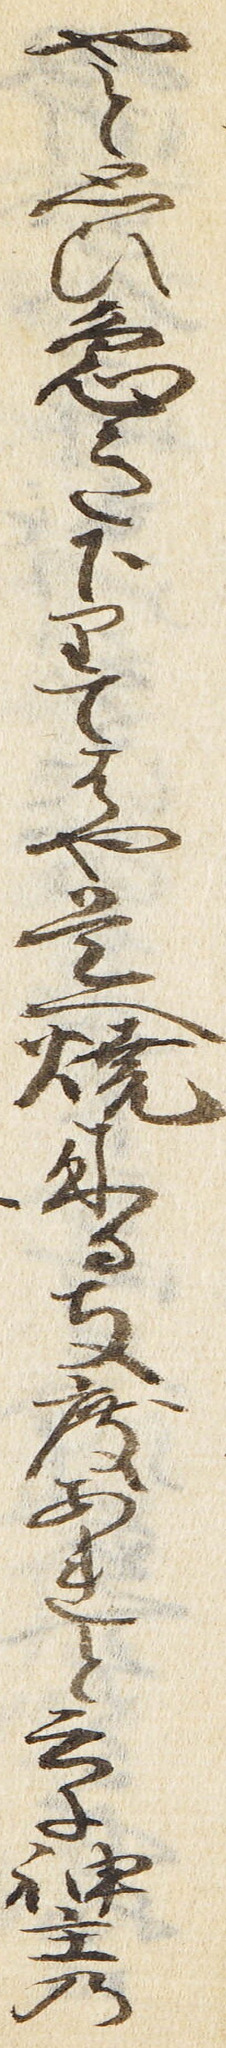やと思ひ急き下りてはや是へ焼来る支度あれと云に神主の
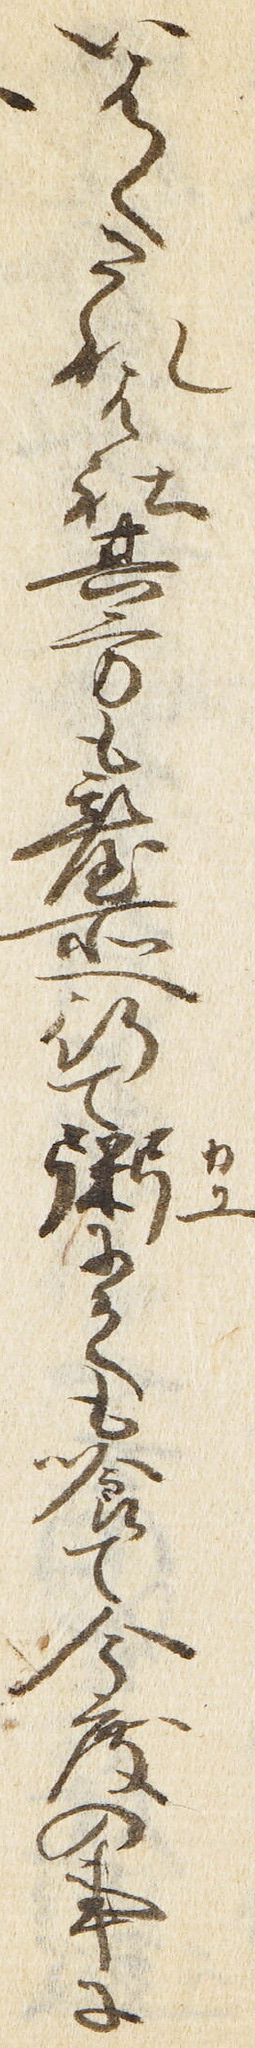いはくされは社其方も産所へ行て粥にても喰て今度の事に
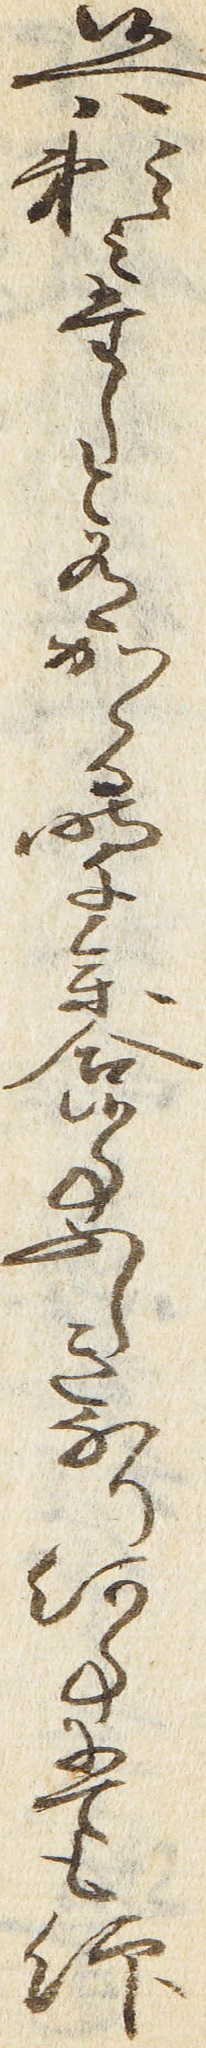候へは頼みたしと有かゝる時に参合候事ふしきなり何事にても仰
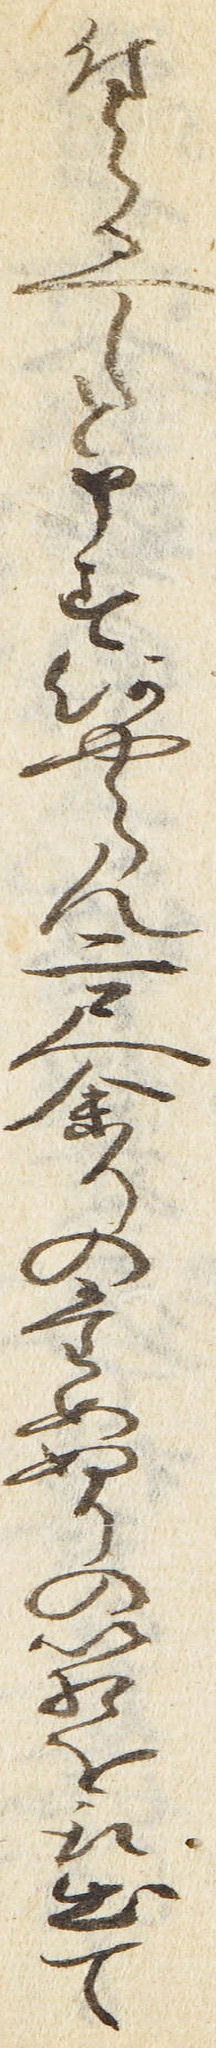付らるへしと申す何やらん二尺余りのためぬりの箱を取出て
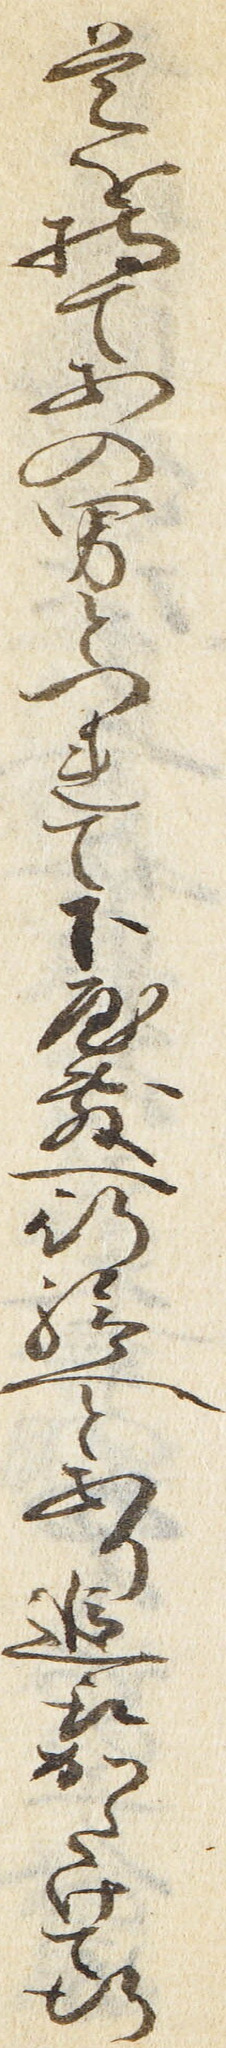是を持てあの男とつれて下屋敷へ行給へとあり追取かたけて行
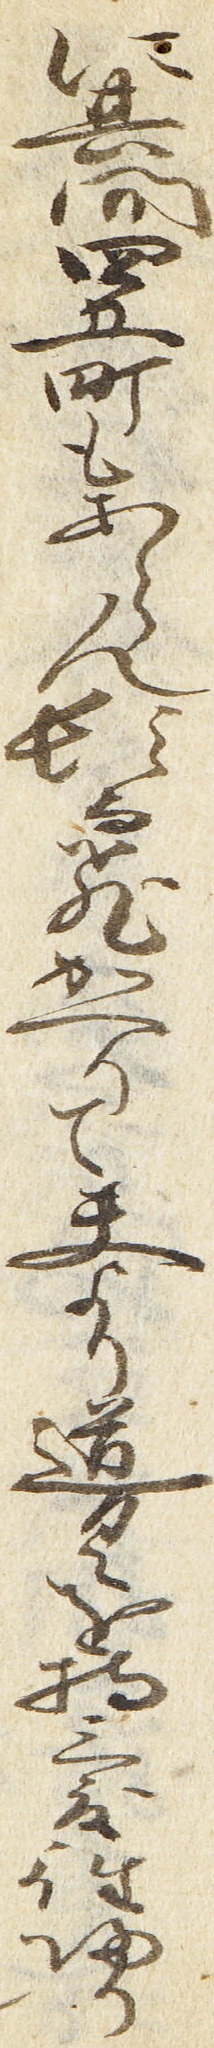に其間四五町もあらん頓而飛かへりて夫より道具を持三度往帰り
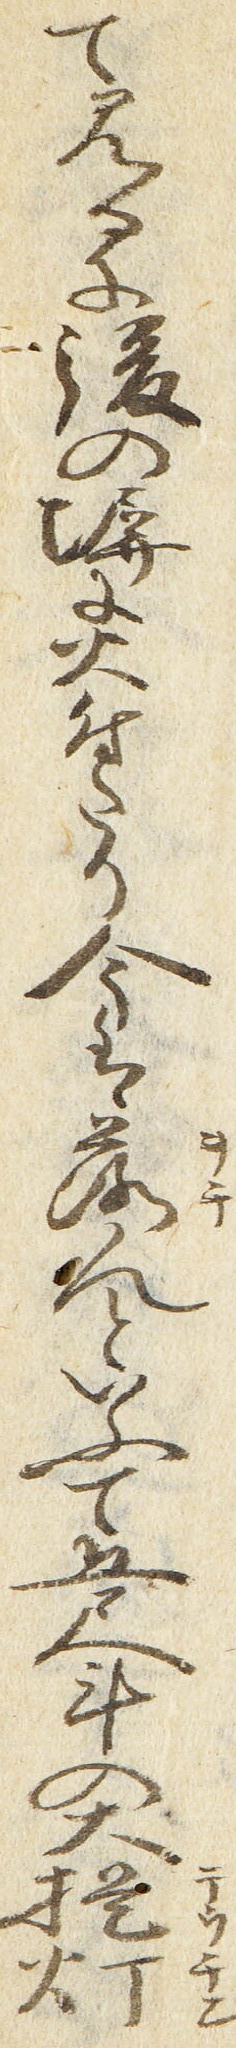て見るに後の塀に火付たり今は落んといふて五尺計の大提灯
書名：海陸世話日記
